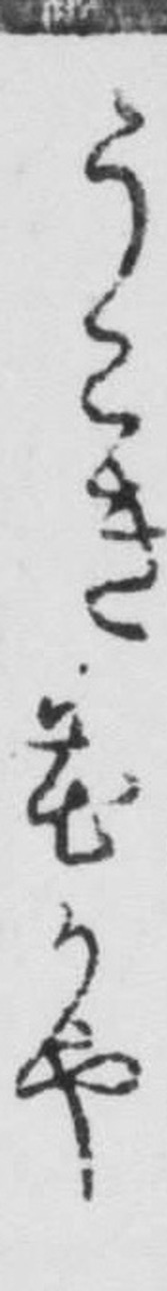うこき花かや
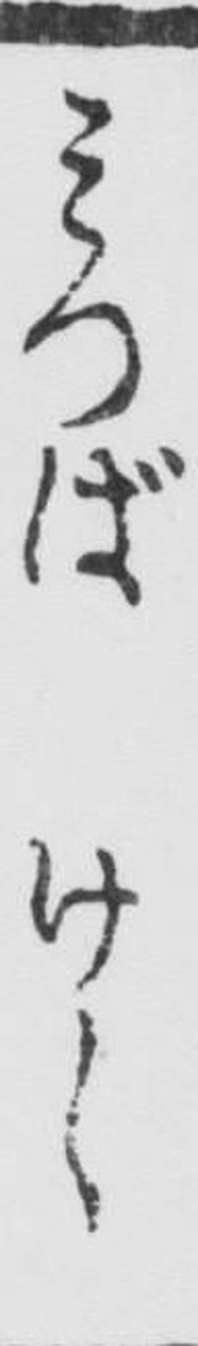みつばけし
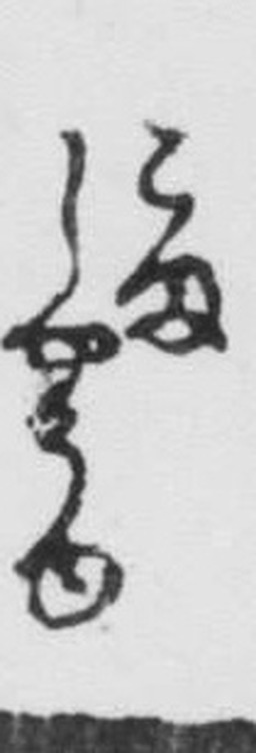しやうゆ
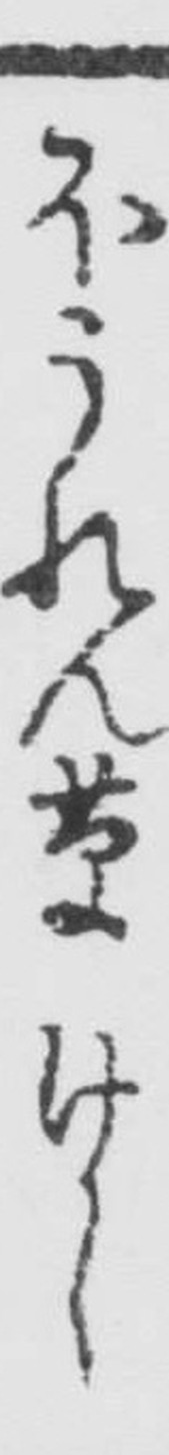ほうれん草けし
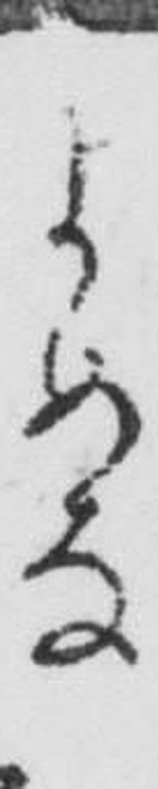よめな
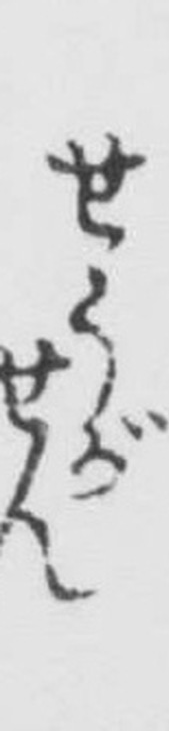せうがず
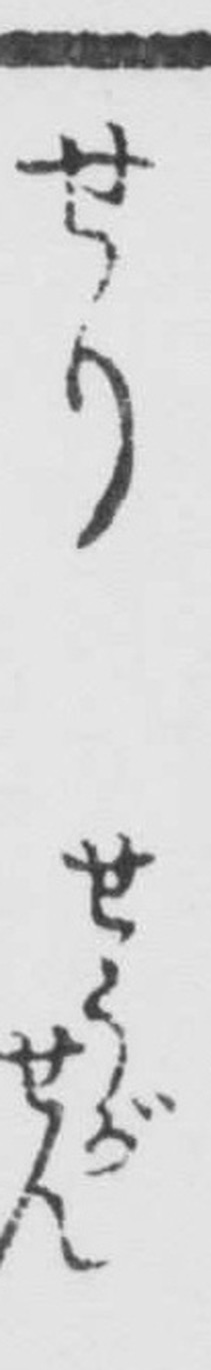せりせうがせん
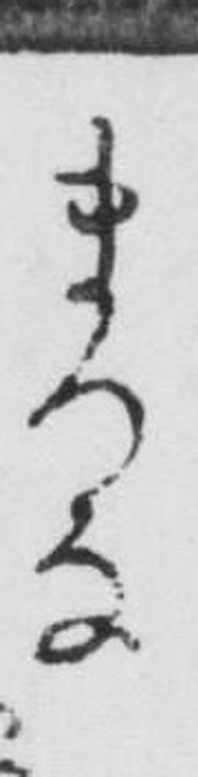まつな
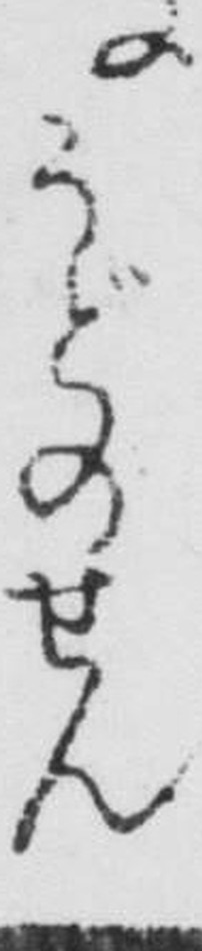うどのせん
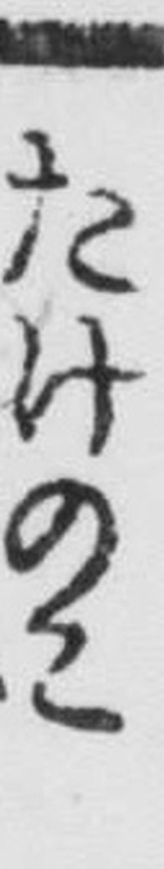たけのこ
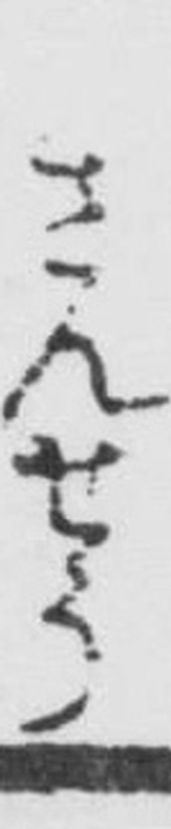さんせう
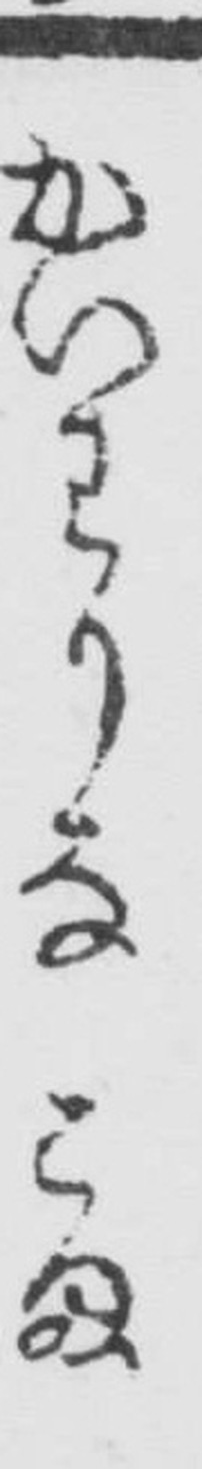かいわりこま
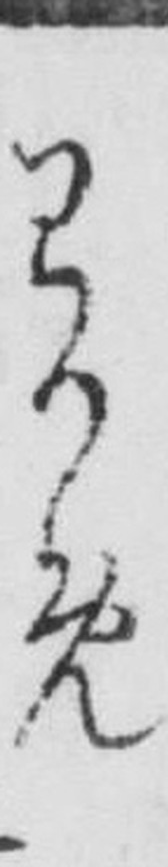わかめ
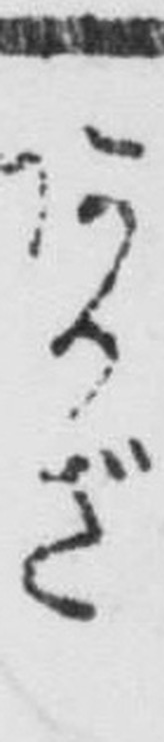あかざ
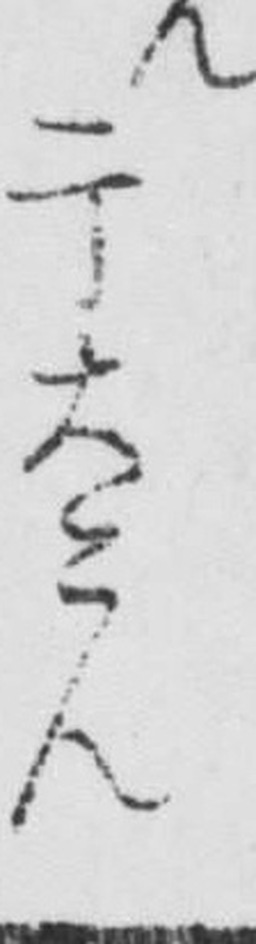守口大こん
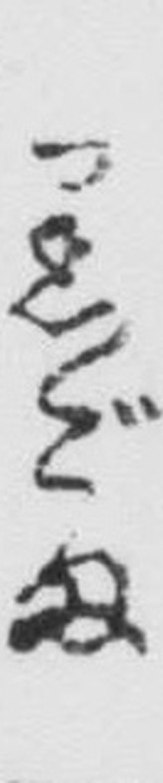黒ごま
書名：諸家通用/即席料理
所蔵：大阪府立大学学術情報センター 国文学研究資料館
